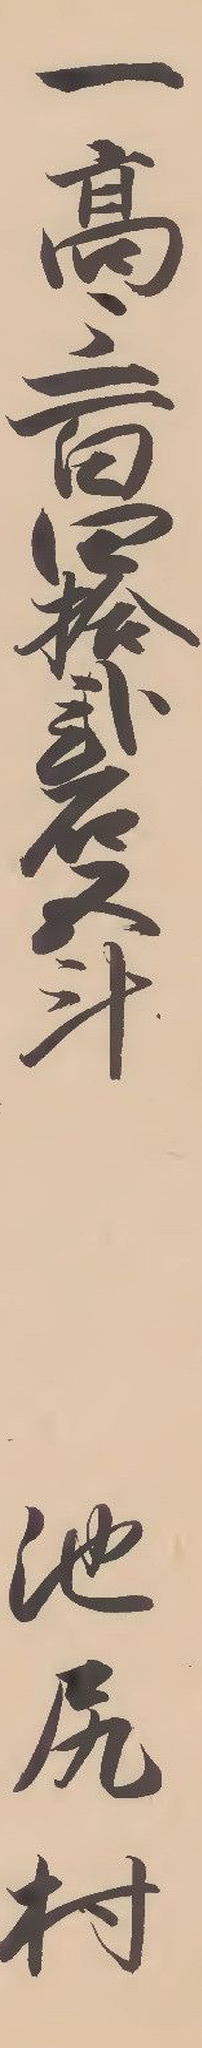一高三百四拾弐石五斗池尻村
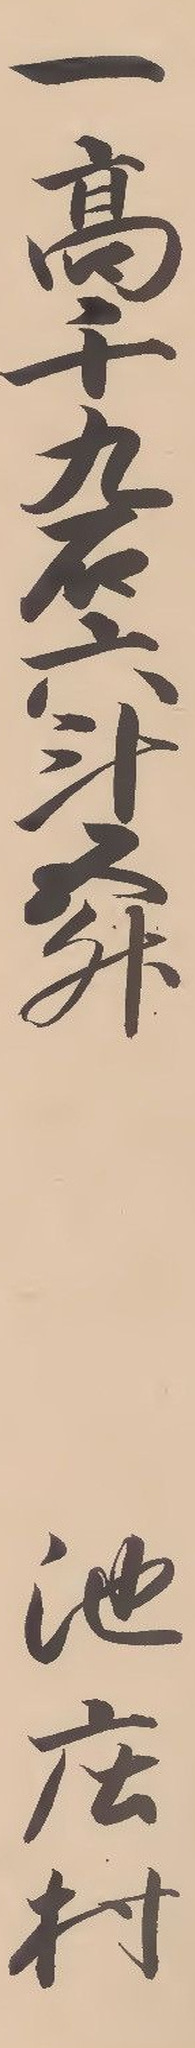一高千九石六斗五升池庄村
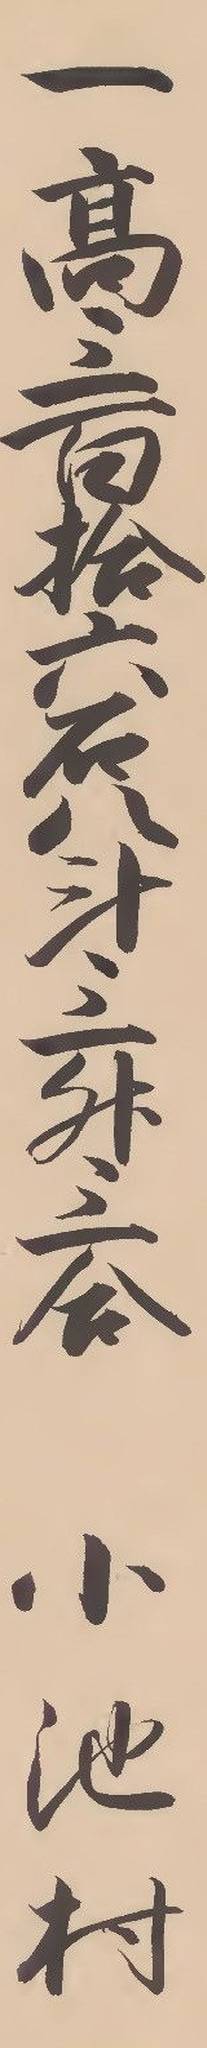一高三百拾六石八斗三升三合小池村
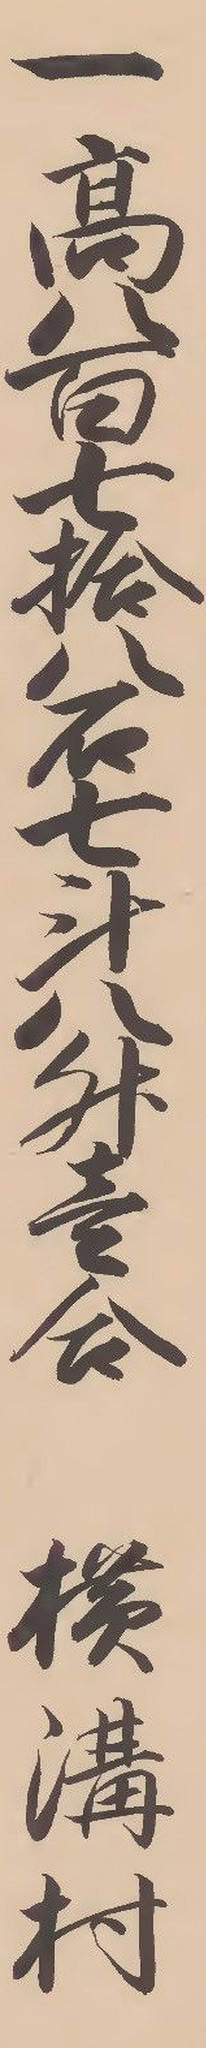一高八百七拾八石七斗八升壱合横溝村
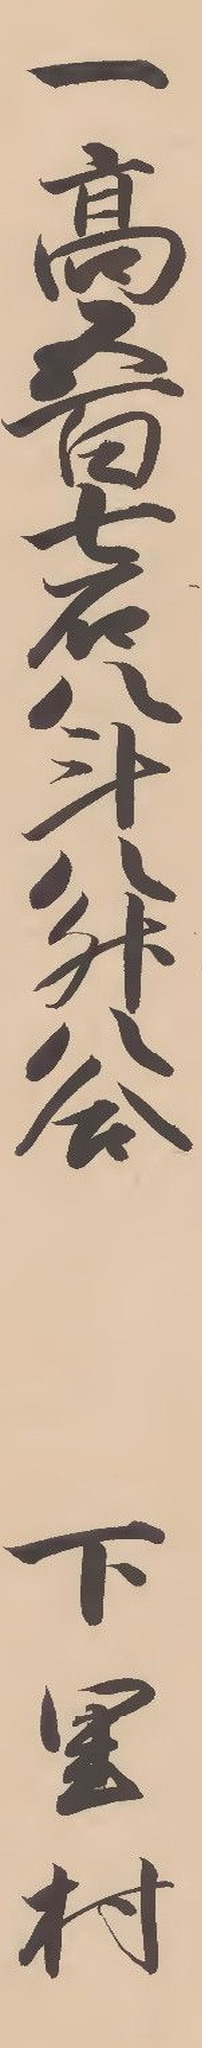一高五百七石八斗八升八合下里村

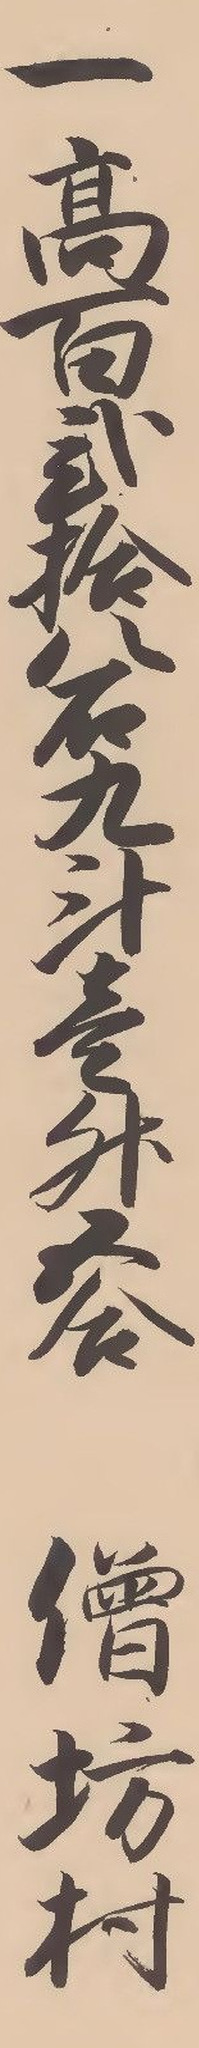一高百弐拾八石九斗壱升五合僧坊村
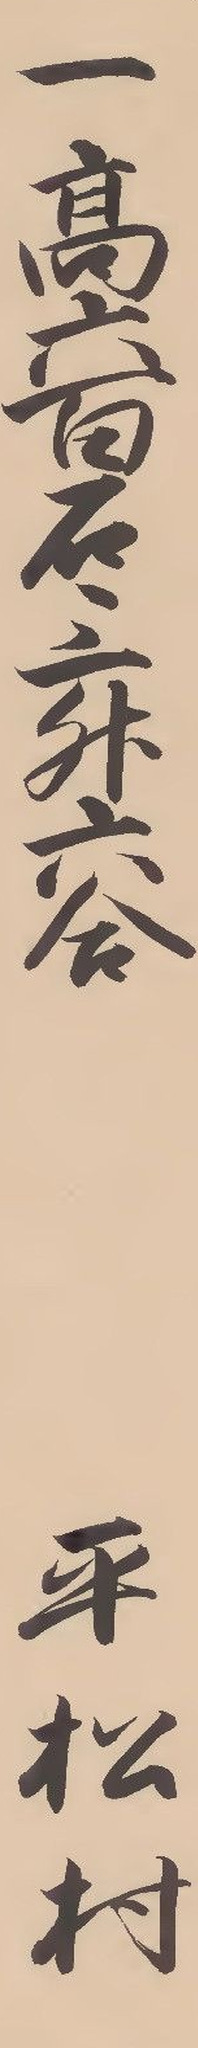一高六百石三升六合平松村
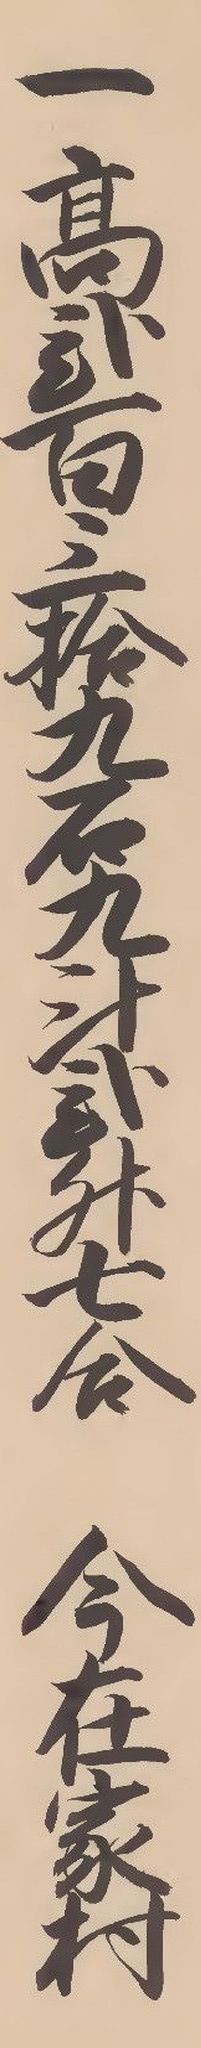一高弐百三拾九石九斗弐升七合今在家村
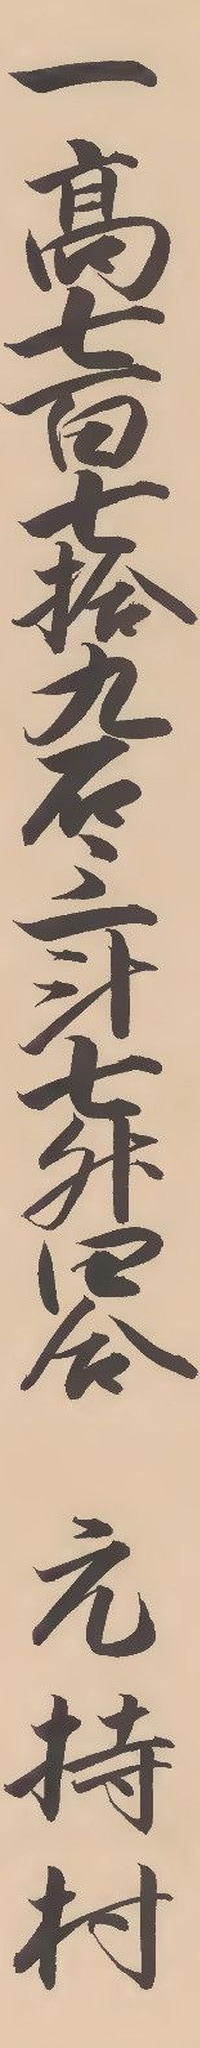一高七百七拾九石三斗七升四合元持村
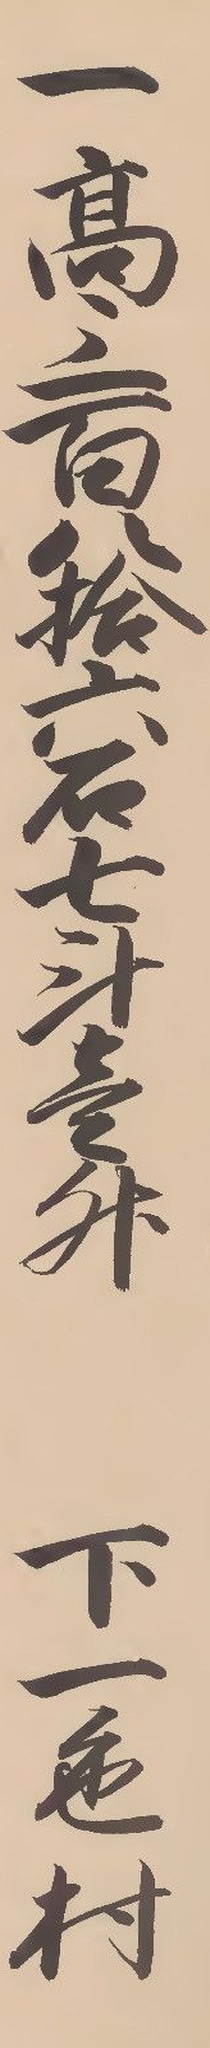一高三百八拾六石七斗壱升下一色村
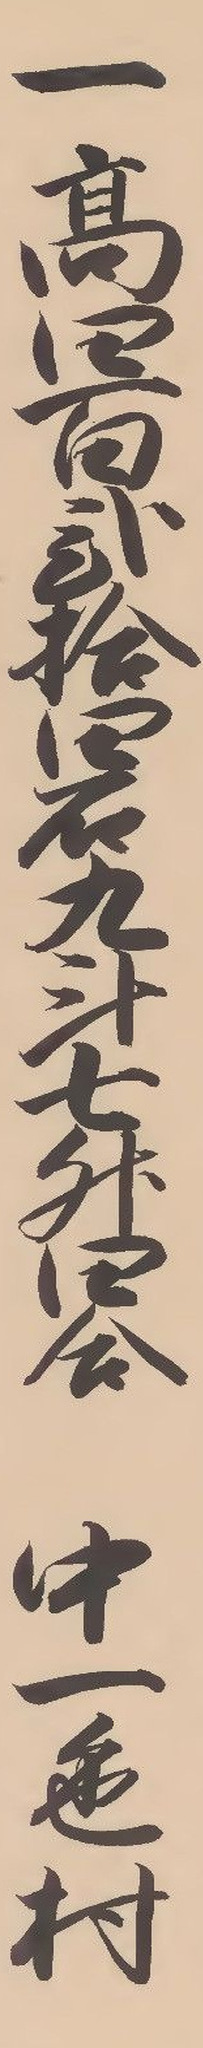一高四百弐拾四石九斗七升四合中一色村
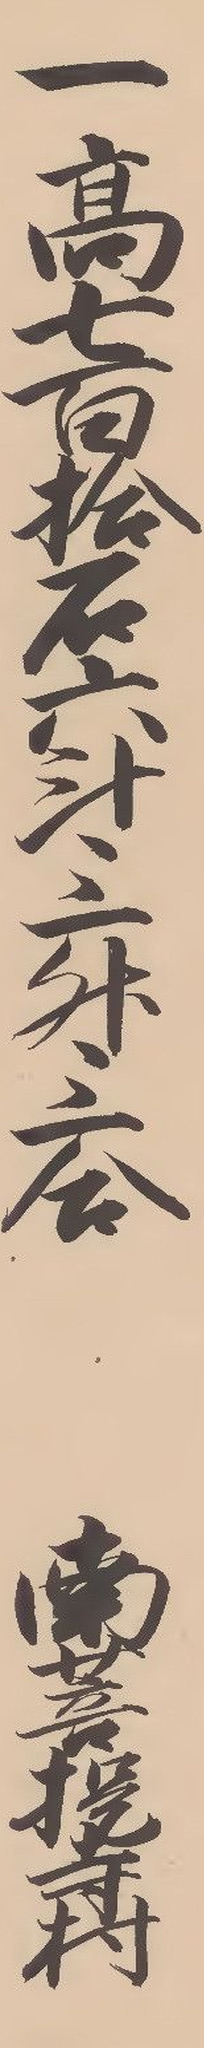一高七百拾石六斗三升三合南菩提寺村
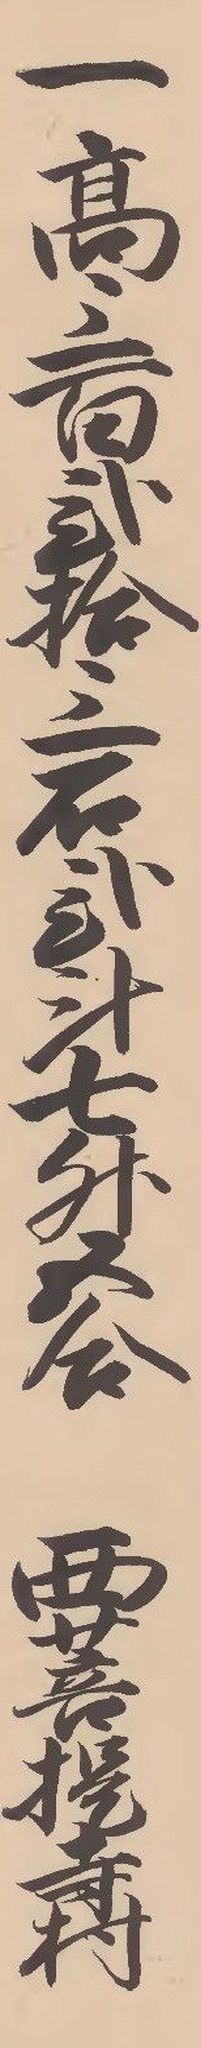一高三百弐拾三石弐斗七升五合西菩提寺村

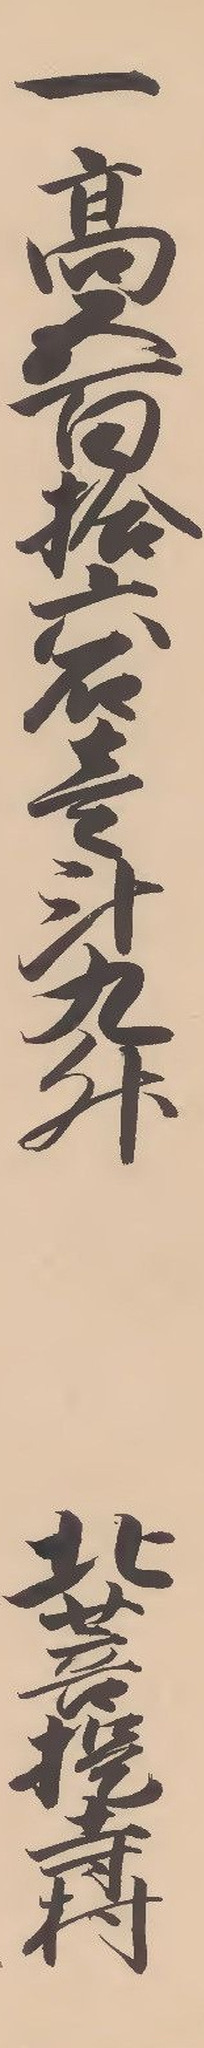一高五百拾六石壱斗九升北菩提寺村
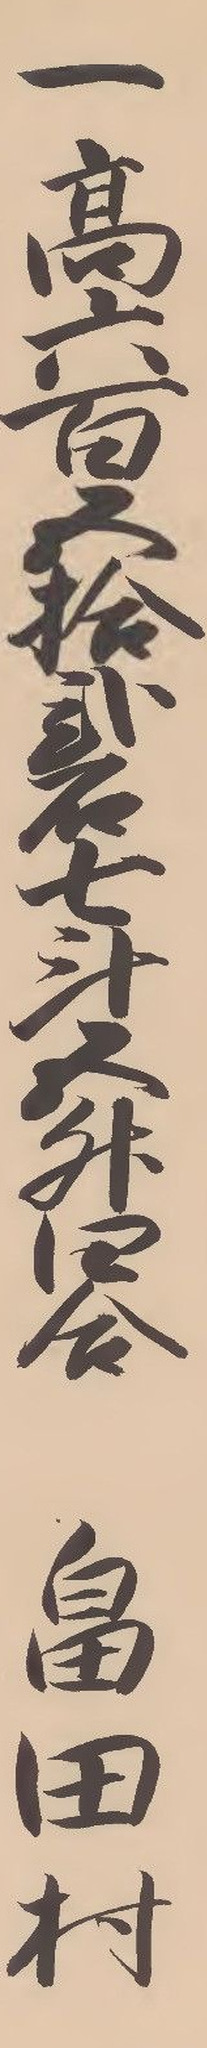一高六百五拾弐石七斗五升四合畠田村
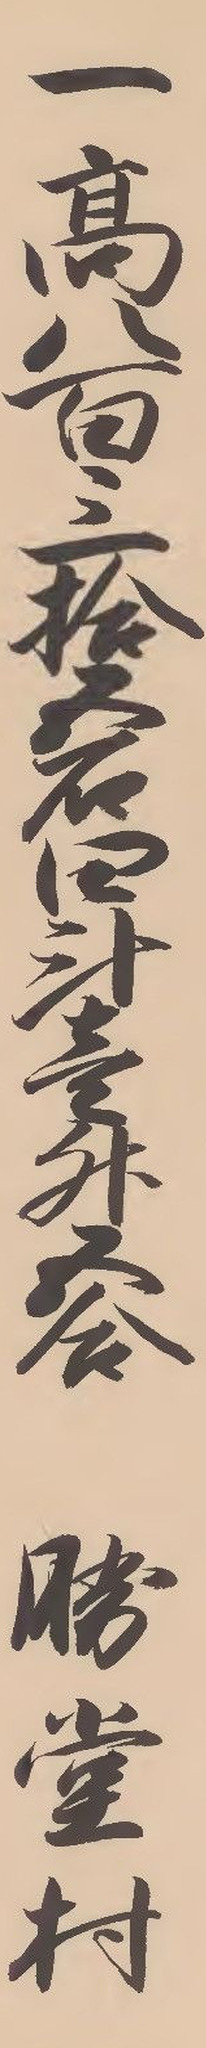一高八百三拾五石四斗壱升五合勝堂村
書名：近江国郷帳
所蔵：国立公文書館 National Archives of Japan
